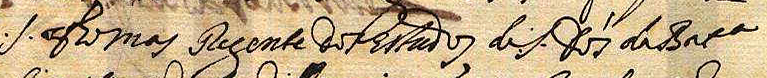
S. thomas Regente dos Estudos de S. Dos̄ da Bata
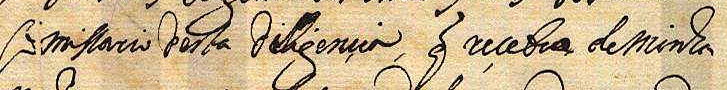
Comissario desta diligencia, q̄ recebeo de minha
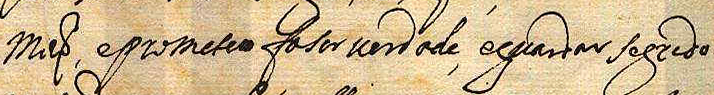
maõ, e prometeo faser uerdade, e guardar segredo
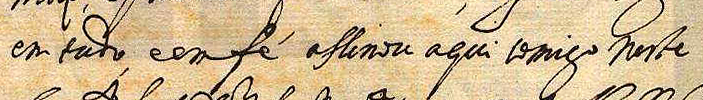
em tudo, e em fé assinou aqui comigo neste
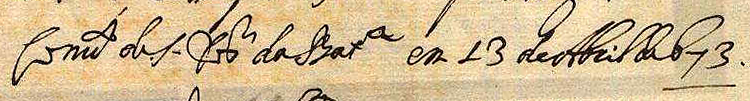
Conuto de S. Dos̄ da Bata em 13 de Abril de 673.
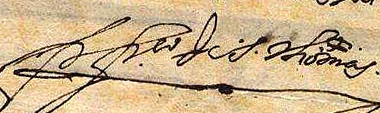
fr frco de s. thomas
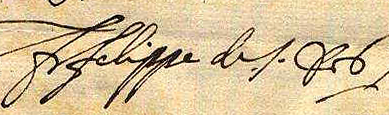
fr felippe de s. Dos̄
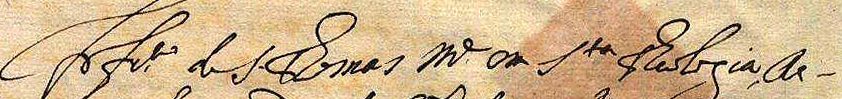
fr fr.co de S. Thomas me na Sta theologia, Re
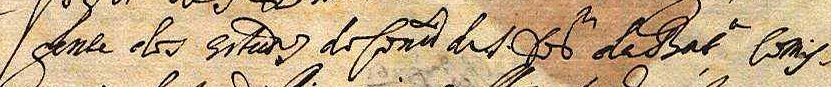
gente dos Estudos do Conuto de S. Dos̄ da Bata Comis
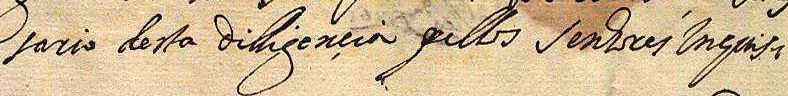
sario desta dilligencia pellos Senhores Inquisi
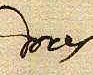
dores
